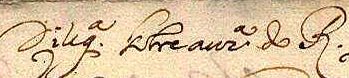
Diliga. sobre auza. do R.
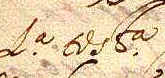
1.ª test.a
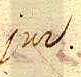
jur.
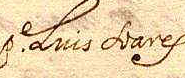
p.e Luis soares
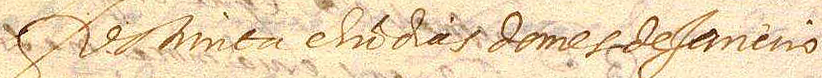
Aos trinta e hū dias do mes de Janeiro
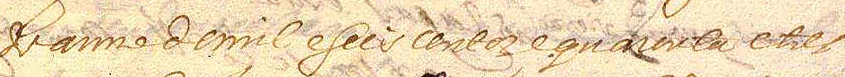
do anno de mil e seeiscentos e quarenta e tres
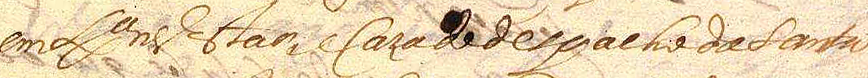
em Lxa nos Estaos, e Caza do despacho da santa
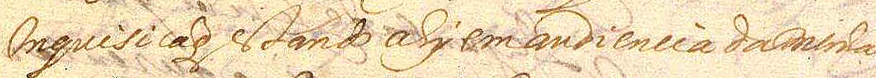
Inquisiçaõ estando ahy em audiencia da menhã
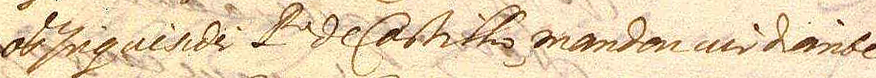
o sor Jnquisidor Po de Castilho, mandou uir diante
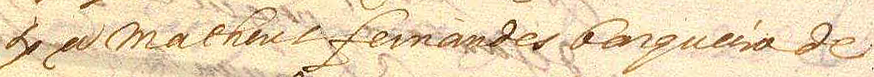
sy a matheus Fernandes barqueiro de
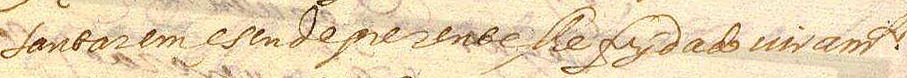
santarem, e sendo presente lhe foy dado iuramto.
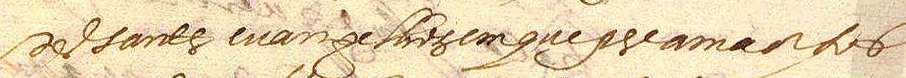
dos santos euangelhos em que pos a maõ sob
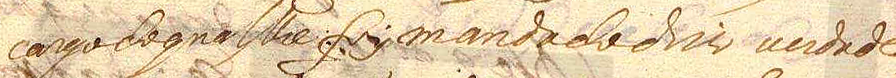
cargo do qual lhe foy mandado dizer uerdade
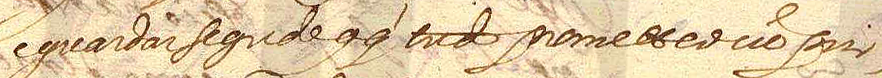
e guardar segredo o q̄ tudo prometteo cūprir,
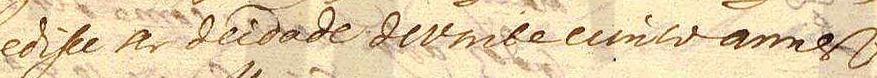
e disse ser de idade de vinte e cinco annos
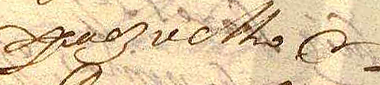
xpaõ velho
